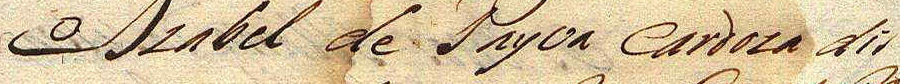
e Izabel de Payva cardoza dis
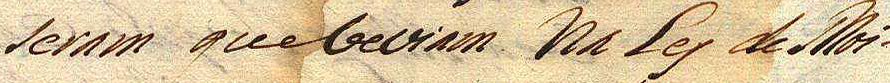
seram que veviam na Ley de Moi
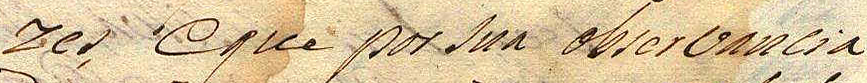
zes, e que por sua observancia
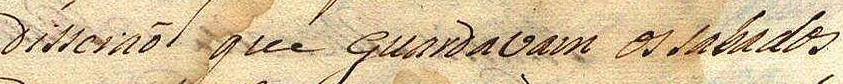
disseraõ que guardavam os sabados
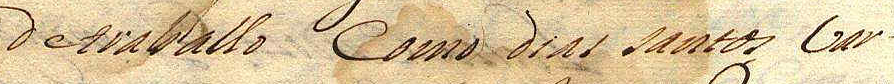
de trabalho como dias santos var
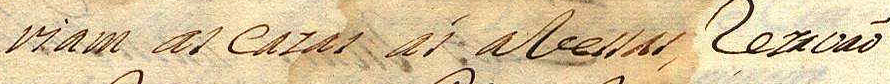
riam as cazas ás avessas, Rezavaõ
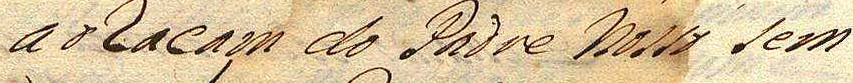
a oRacam do Padre nosso sem
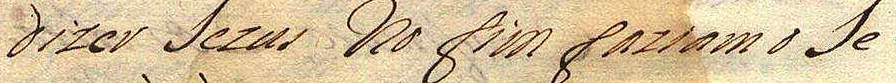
dizer Iezus no fim faziam o Ie
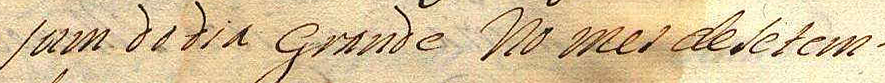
jum do dia grande no mes de setem
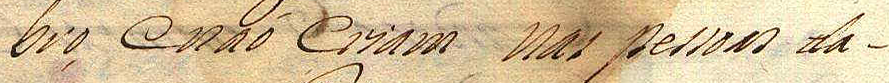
bro, e naõ criam nas pessoas da
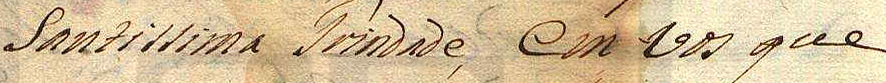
Santissima Trindade, em vos que
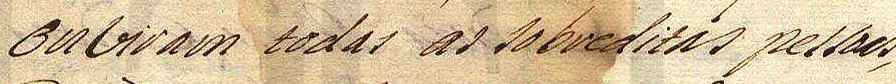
ouviram todas as sobreditas pessoas,
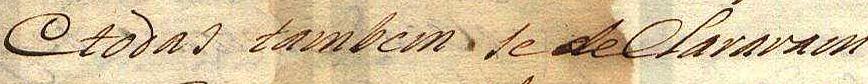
e todas tambem se declararam
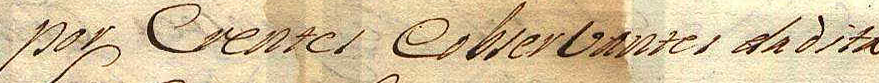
por Crentes e observantes da dita
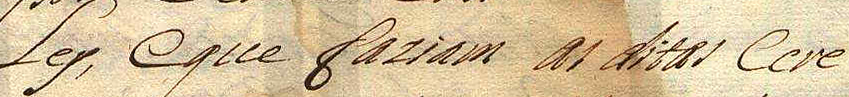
Ley, e que faziam as ditas cere
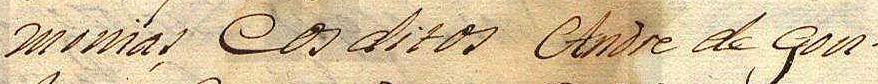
monias, e os ditos Andre de gou
